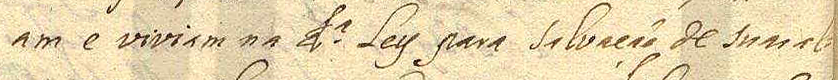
am e viviam na d̄a. Ley para salvaçaõ de suas al
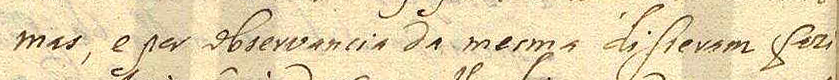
mas, e por observancia da mesma disseram fazi
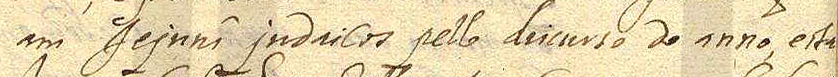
am Jejuns judaiCos pello discurso do anno, esta
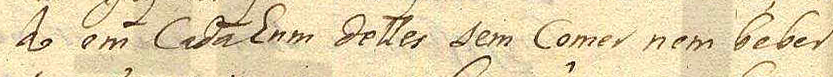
do em Cada hum delles sem Comer nem beber
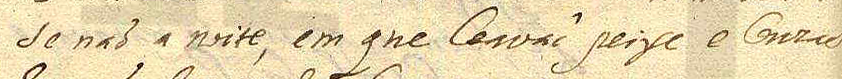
senaõ a noite, em que Ceavaõ peixe e Couzas
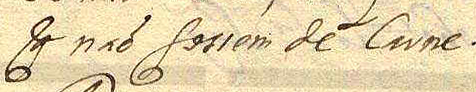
q̄ naõ fossem de Carne.
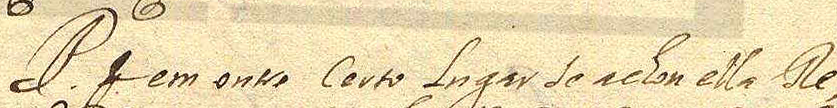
P. q em outro Certo Lugar se achou ella Re,
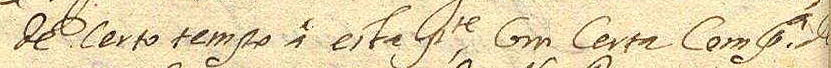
de certo tempo à esta pte, com Certa Comp.a d
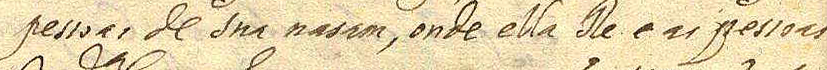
pessoas de sua nasam, onde ella Re e as pessoas
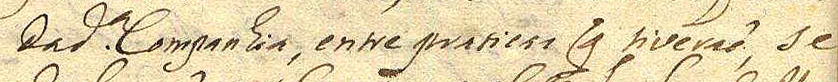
da d.a Companhia, entre praticas q̄ tiveraõ, se
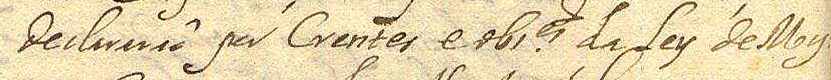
declararaõ por Crentes e obs.es da Ley de Moy
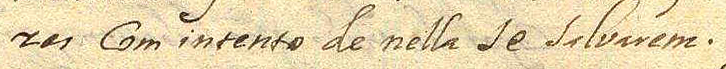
zes Com intento de nella se salvarem.
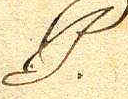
P.
